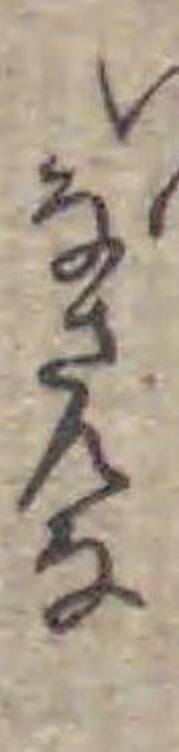なさんな
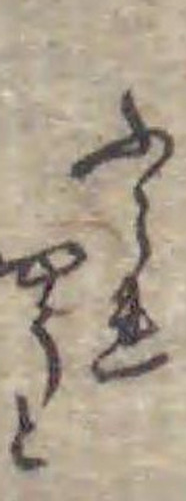ふられ
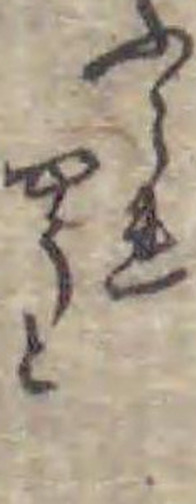やうと
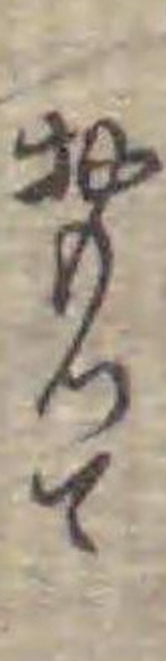おもつて

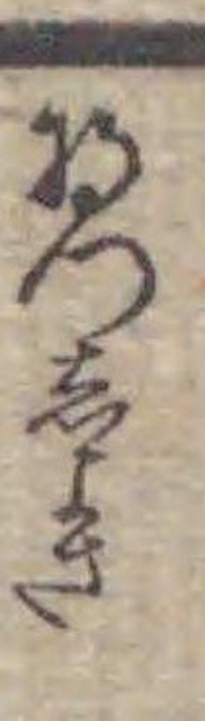将門しよさ
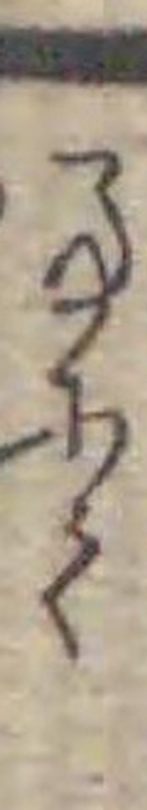事にて
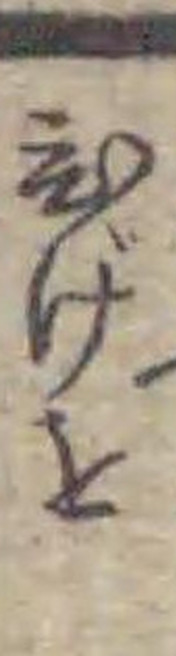ひげを
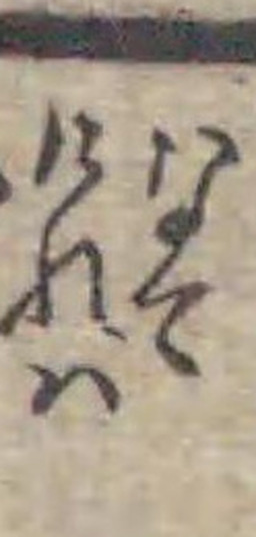けれは
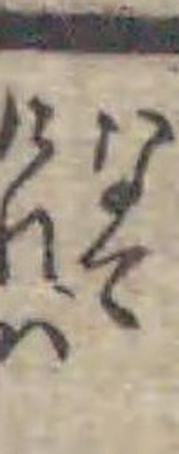けれは
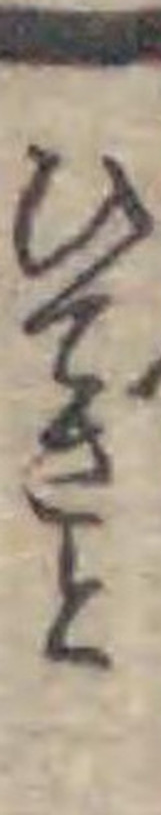ひてさと
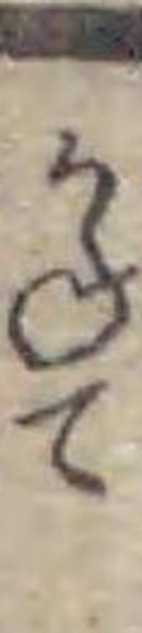かねて
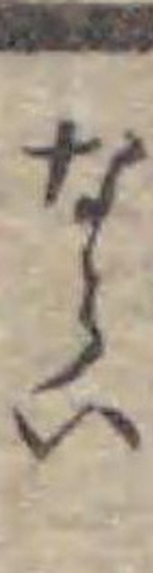ならい
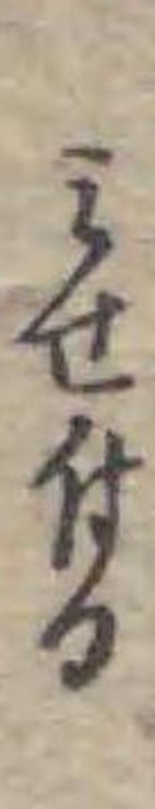みせ付る
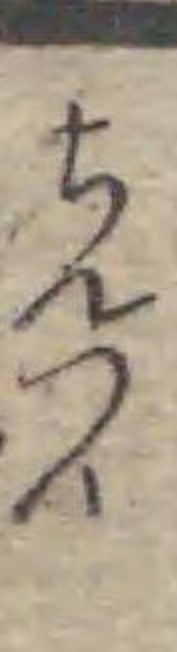ちんつん
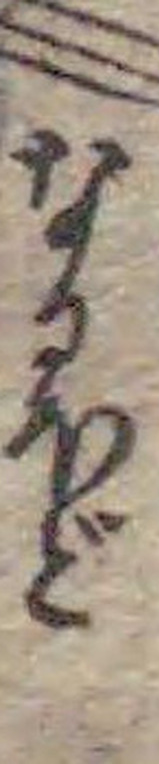なるほど
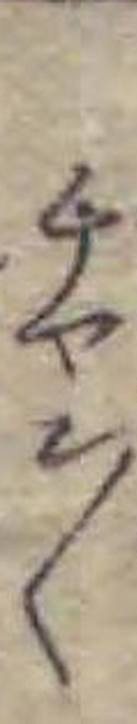チヤン〳〵
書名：時代世話二挺皷 : 2巻
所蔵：国立国会図書館 National Diet Library, JAPAN
